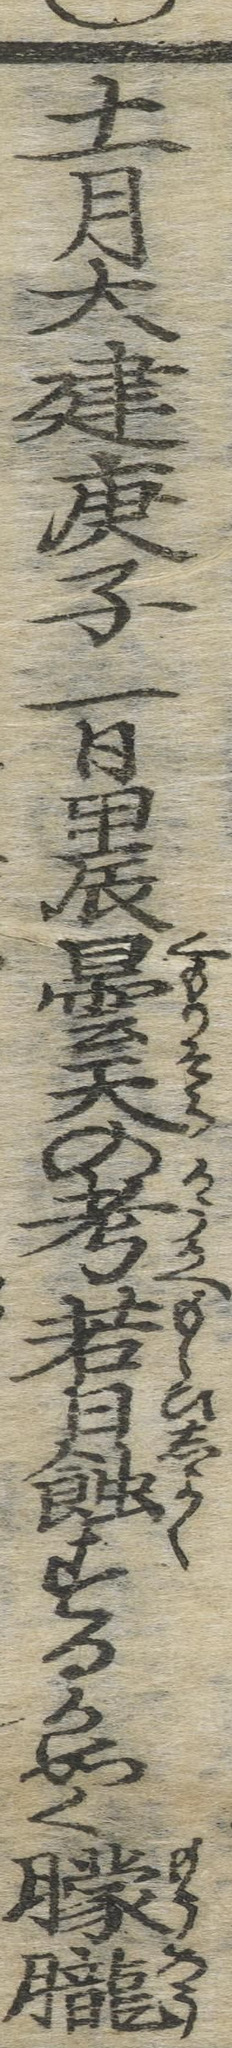十一月大建庚子一日甲辰曇天の考若日蝕するか如く朦朧
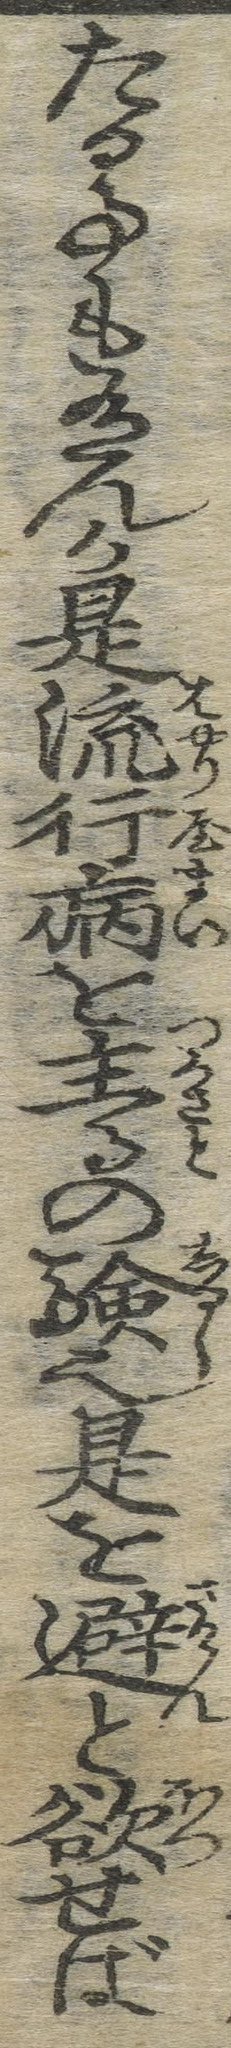たる事も有んか是流行病を主るの験也是を避と欲せば

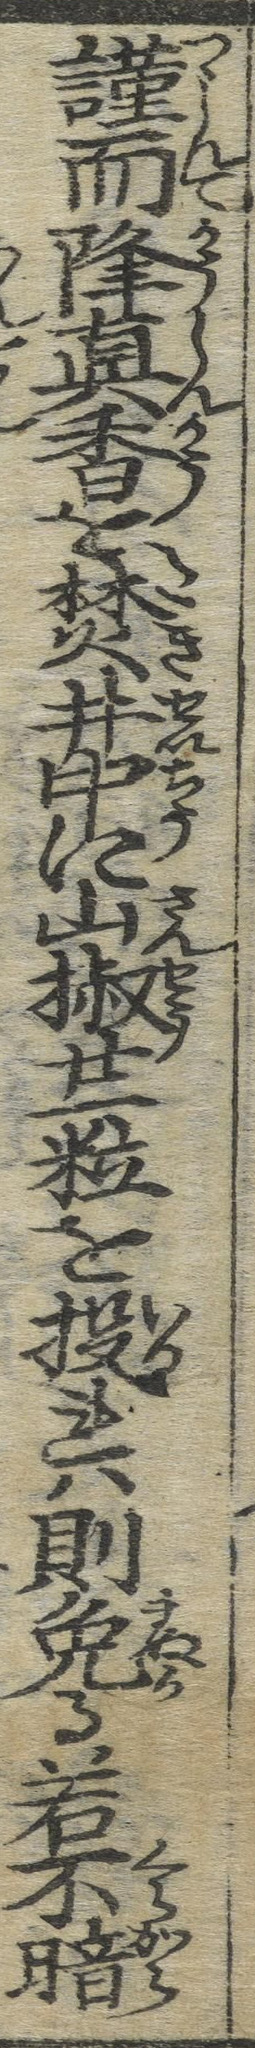謹而降真香を焚井中に山椒廿一粒を投れは則免る若不暗
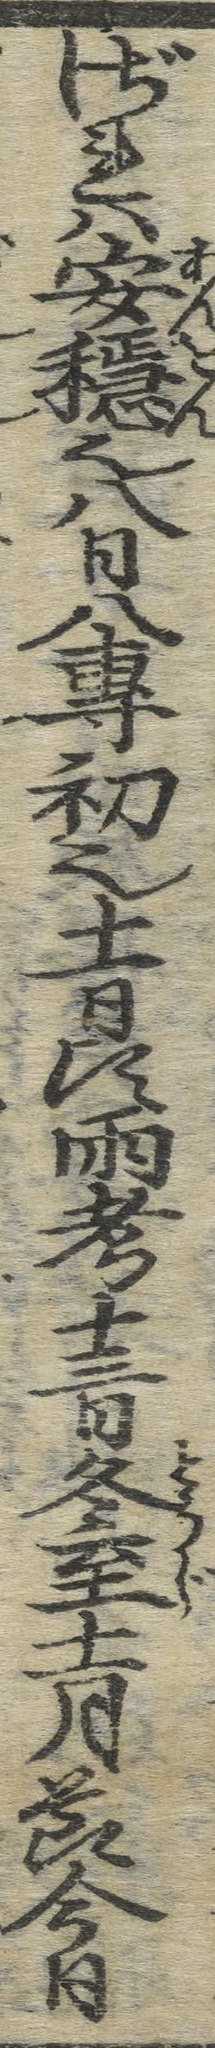ざれは安穏也八日八専初也十一日頃雨考十三日冬至十一月節今日
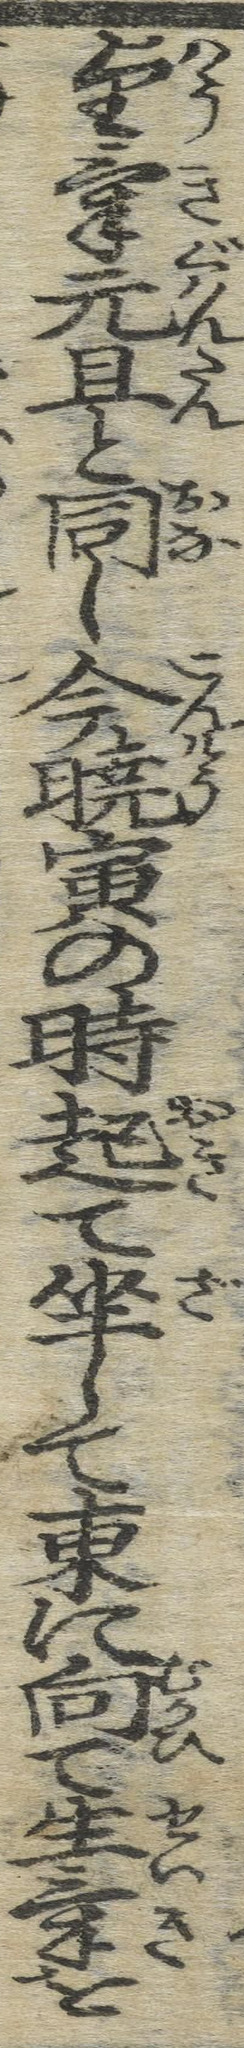望気元旦と同し今暁寅の時起て坐して東に向て生気を
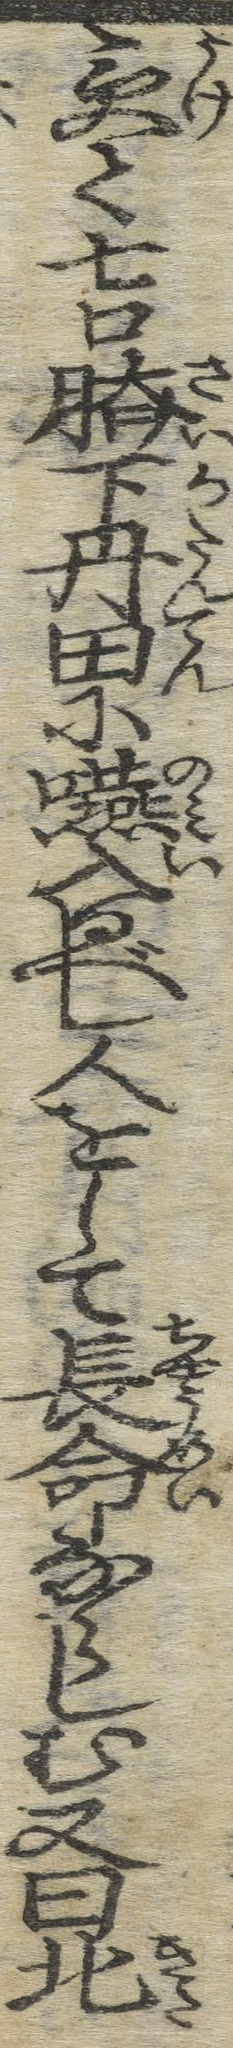受て七口臍下丹田に嚥入るべし人をして長命ならしむ又曰北
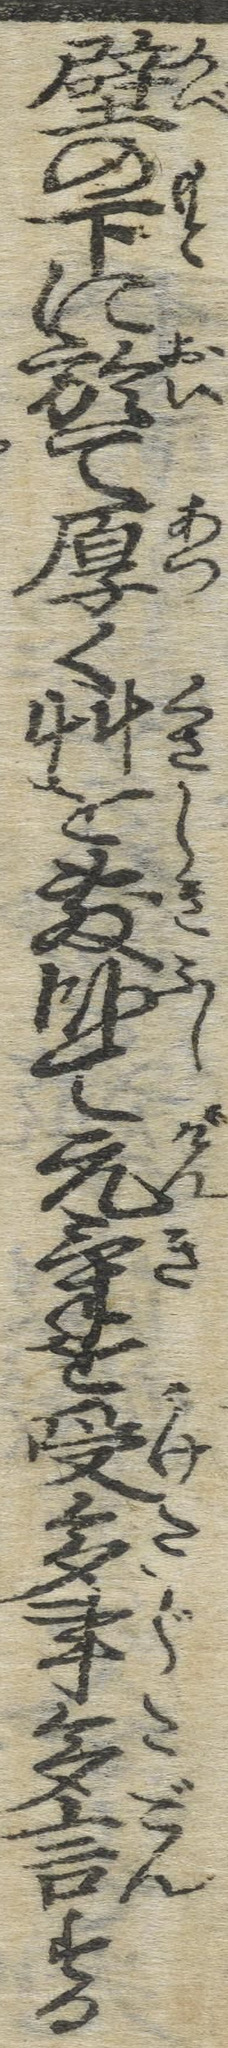壁の下に於て厚く艸を敷臥て元気を受多事多言する
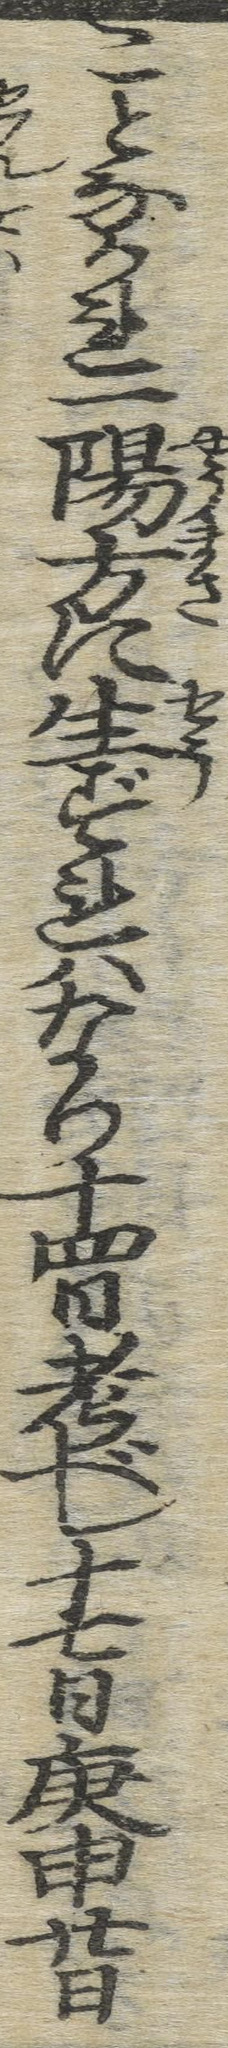ことなかれ一陽方に生ずれはなり十四日考べし十七日庚申廿日
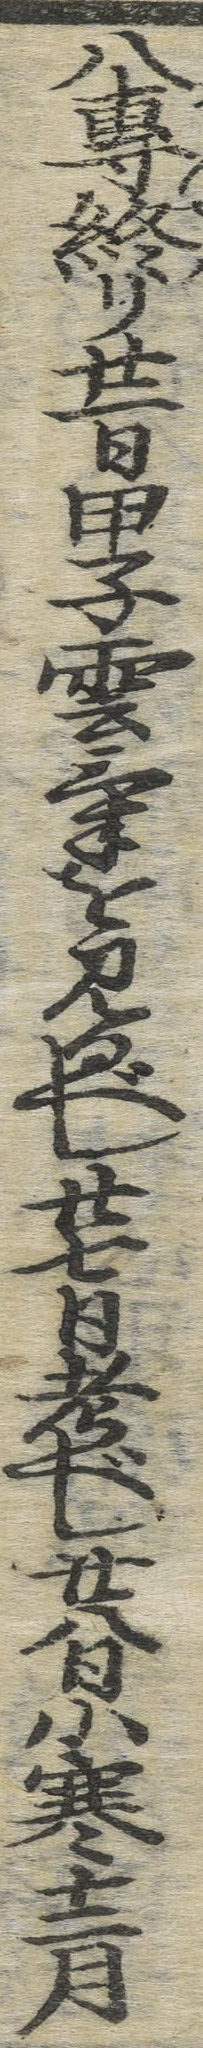八専終り廿一日甲子雲気を見るべし廿七日考べし廿八日小寒十二月
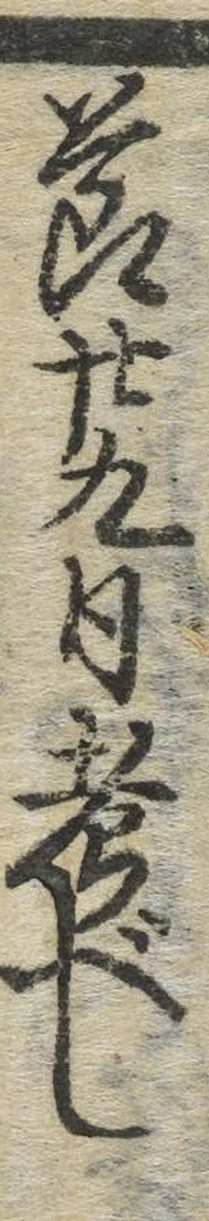節廿九日考べし
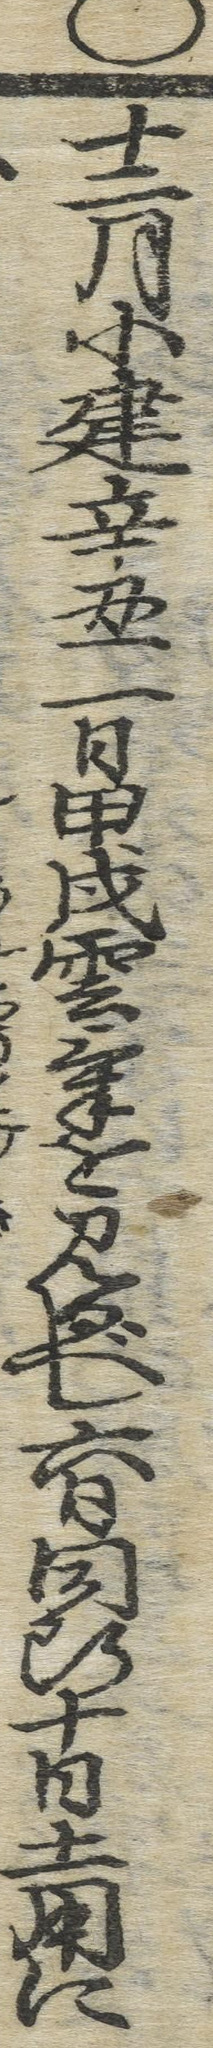十二月小建辛丑一日甲戌雲気を見るべし六日同即十日土用に
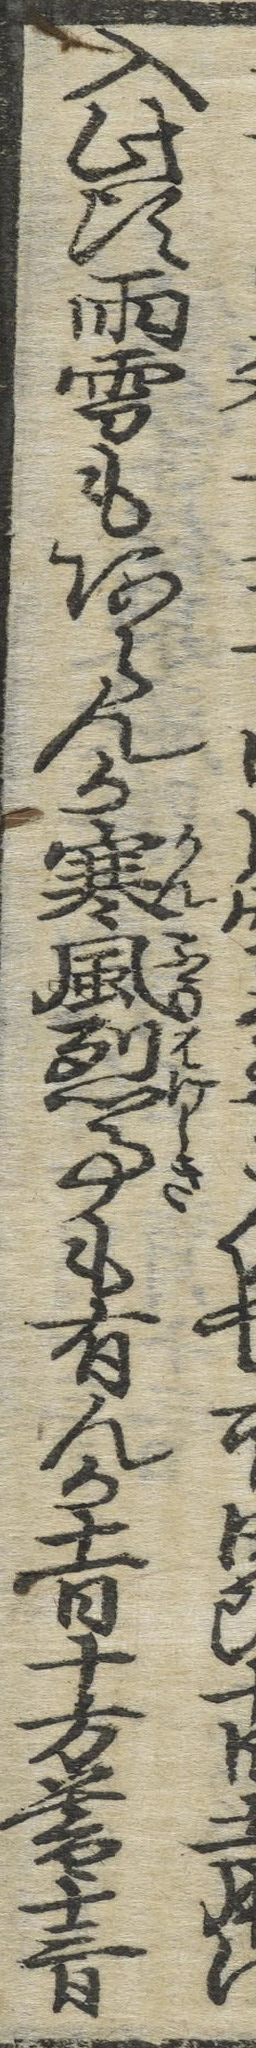入此頃雨雪もあらんか寒風烈事も有んか十一日十方暮十三日
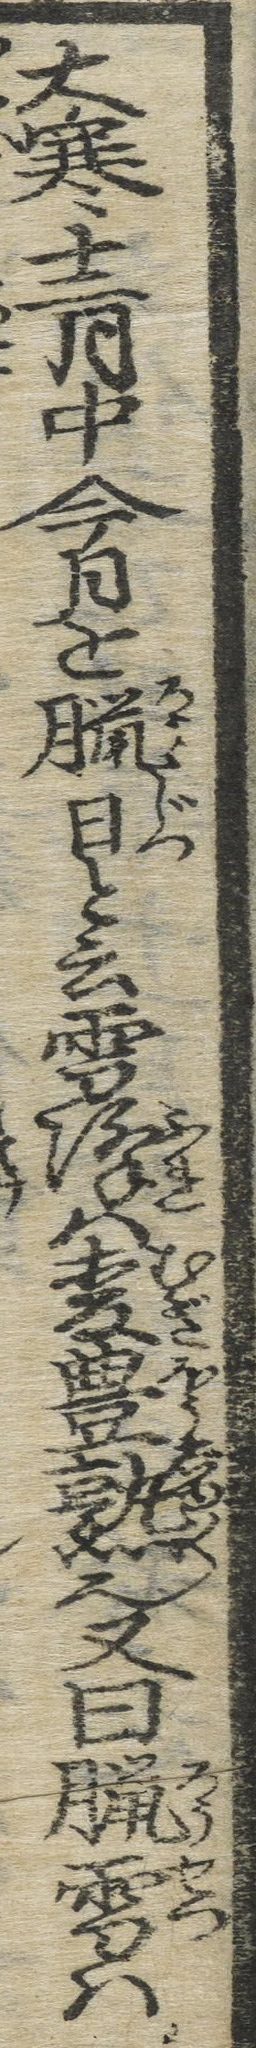大寒十二月中今日を臘日と云雪降は麦豊熟也又曰臘雪は
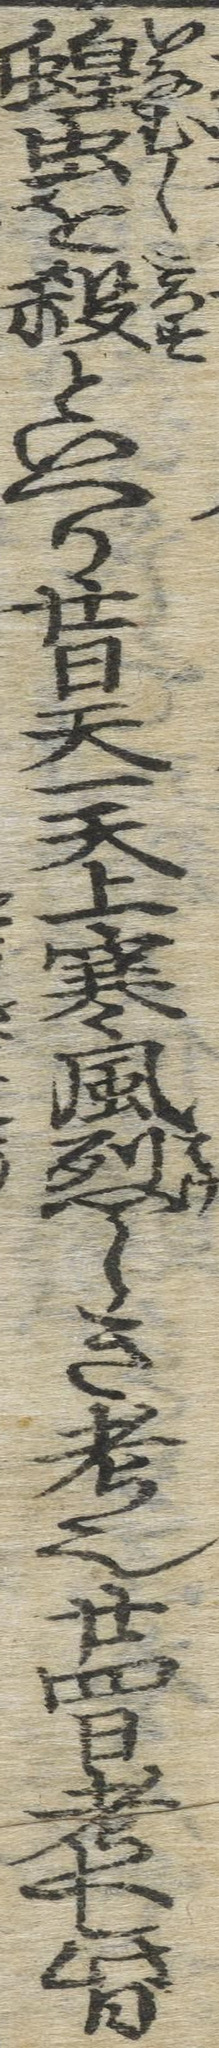蝗虫を殺といへり廿日天一天上寒風烈しき考也廿四日考へし此日
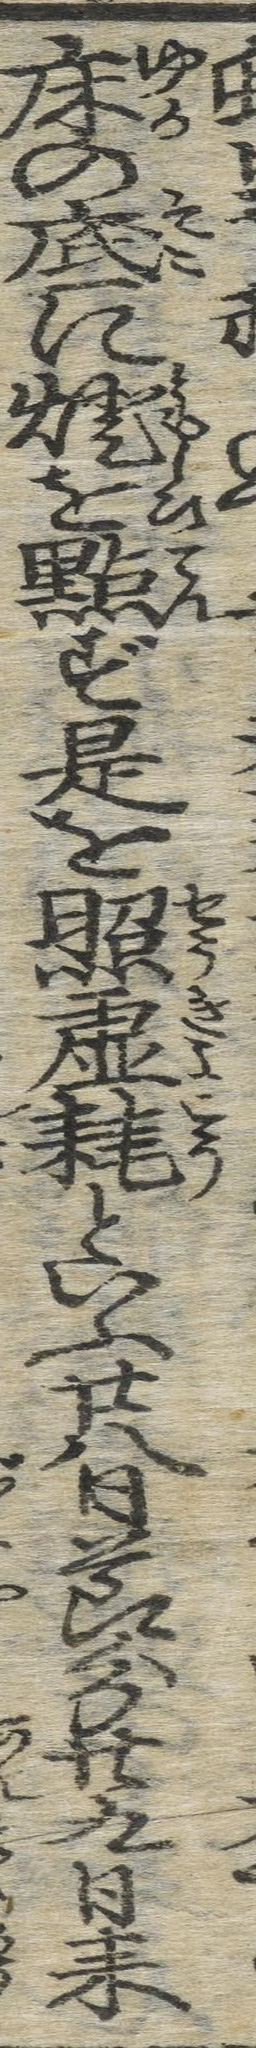床の底に燈を点ず是を照虚耗といふ廿八日節分廿九日来
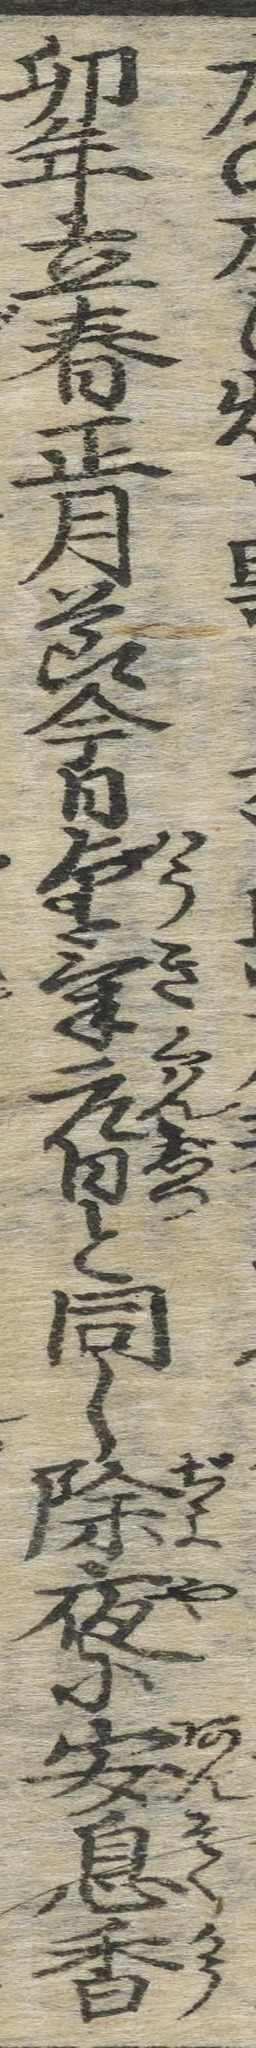卯年立春正月節今日望気元日と同じ除夜に安息香
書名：[晴雨考]
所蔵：東京大学地震研究所図書室 Earthquake Research Institute Library, The University of Tokyo, JAPAN
